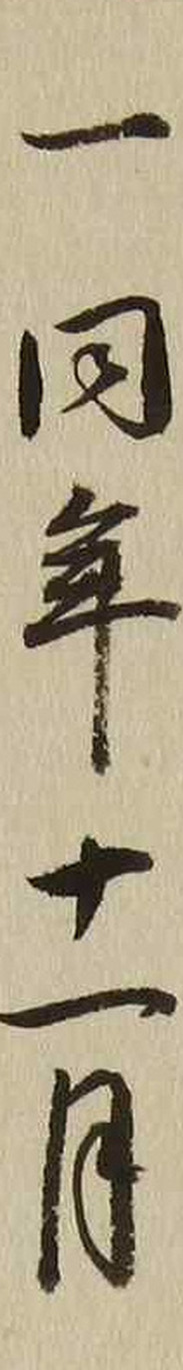一同年十一月
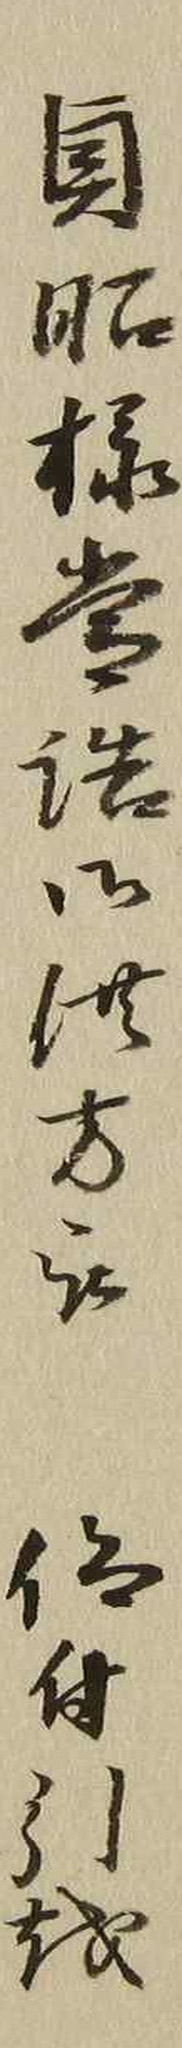貞昭様常詰御供方被仰付引越
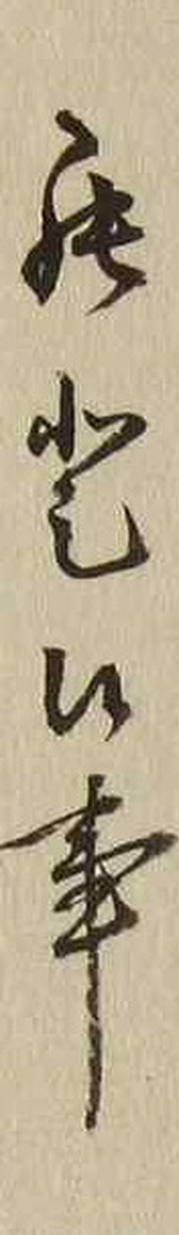罷登候事
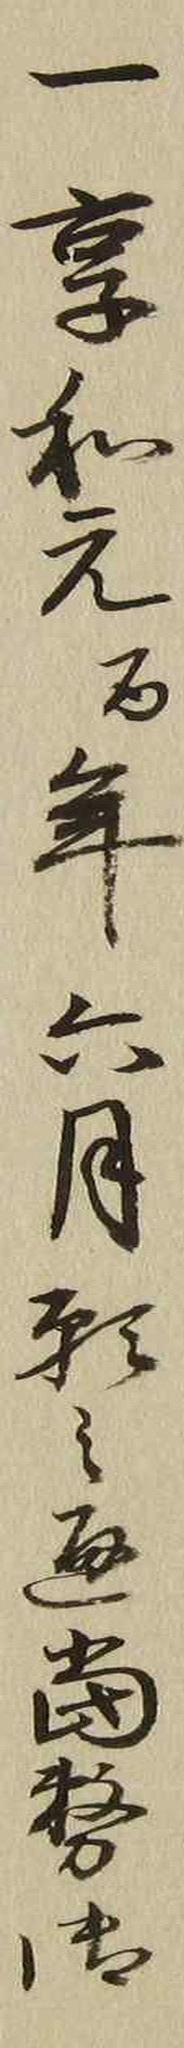一享和元酉年六月願之通当務御
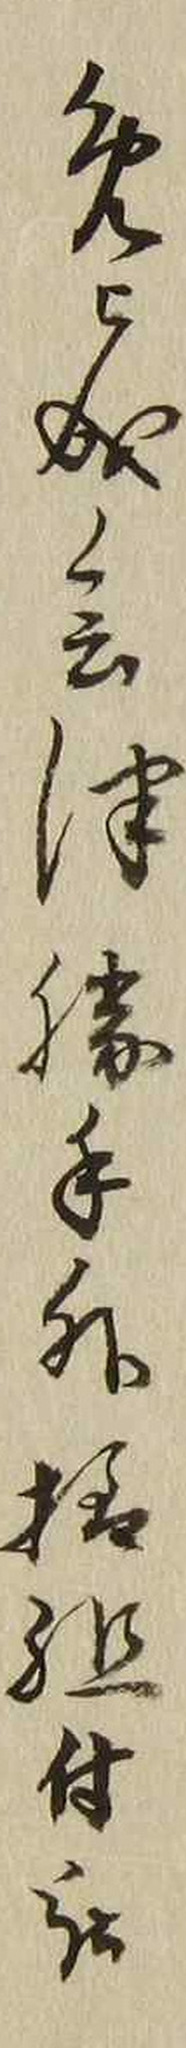免被成会津勝手外様組付被
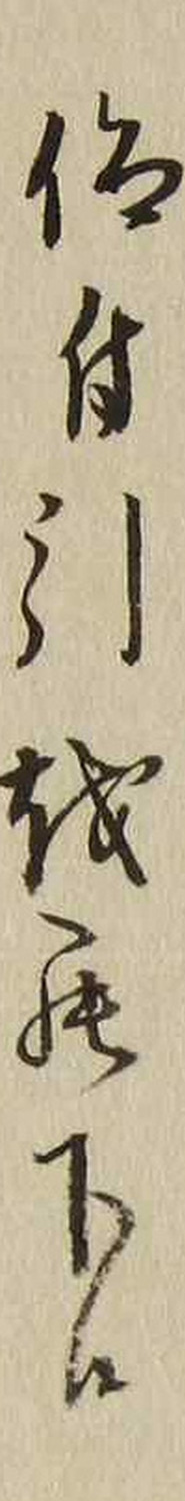仰付引越罷下候
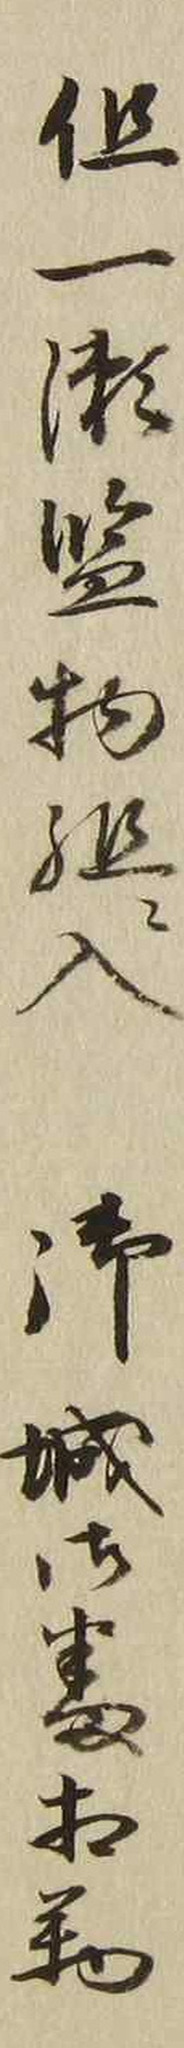但一瀬監物組ニ入御城御番相勤

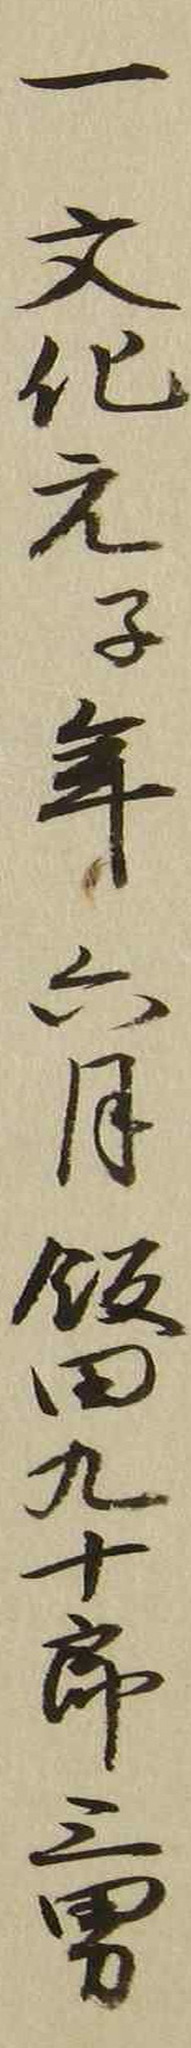一文化元子年六月飯田九十郎三男
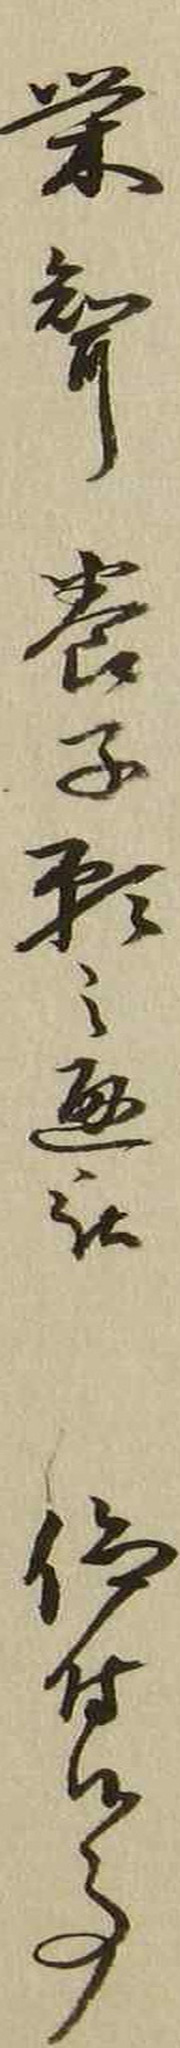栄婿養子願之通被仰付候事
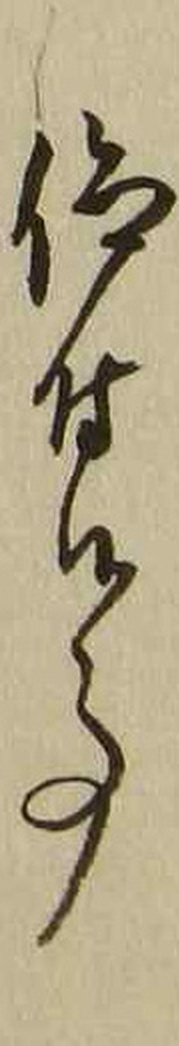仰付候事
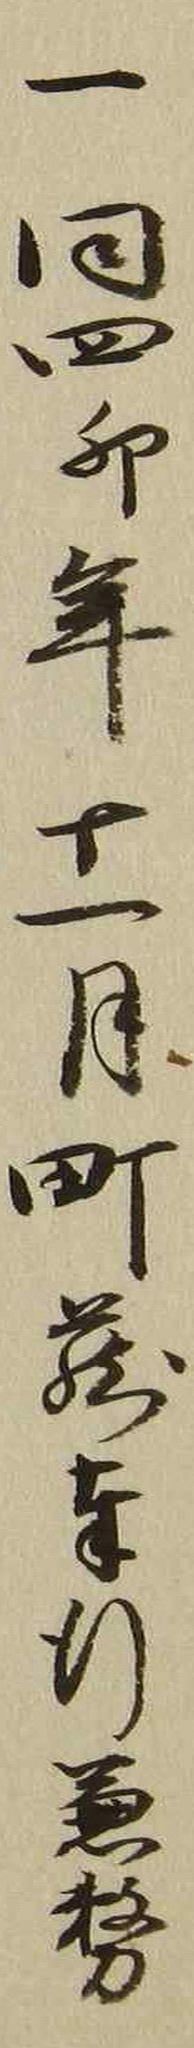一同四卯年十一月町蔵奉行兼務
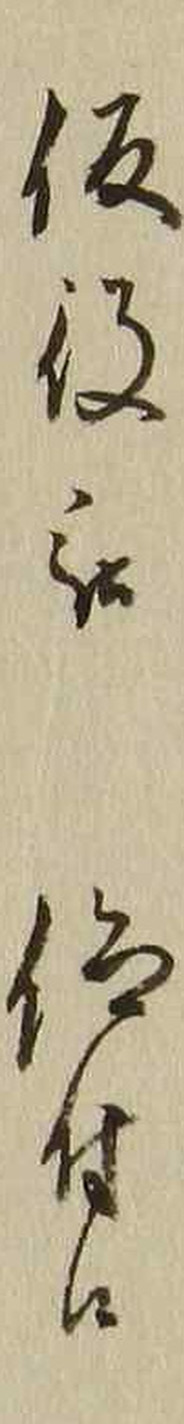仮役被仰付候
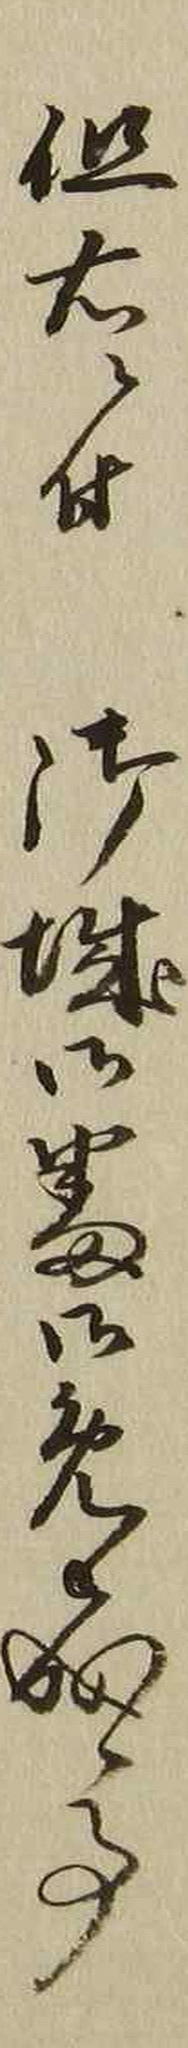但右ニ付御城御番御免被成候事
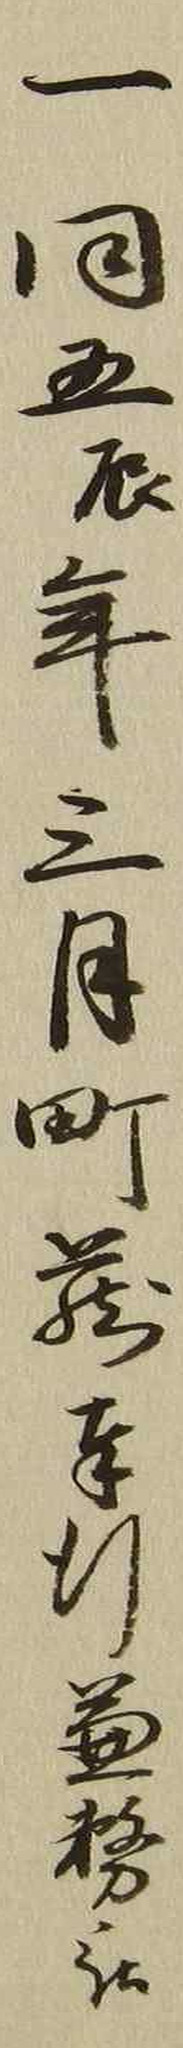一同五辰年三月町蔵奉行兼務被
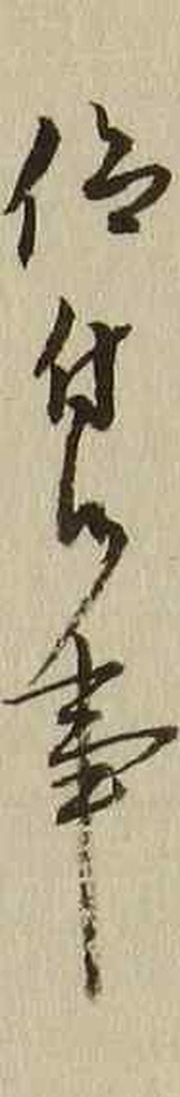仰付候事
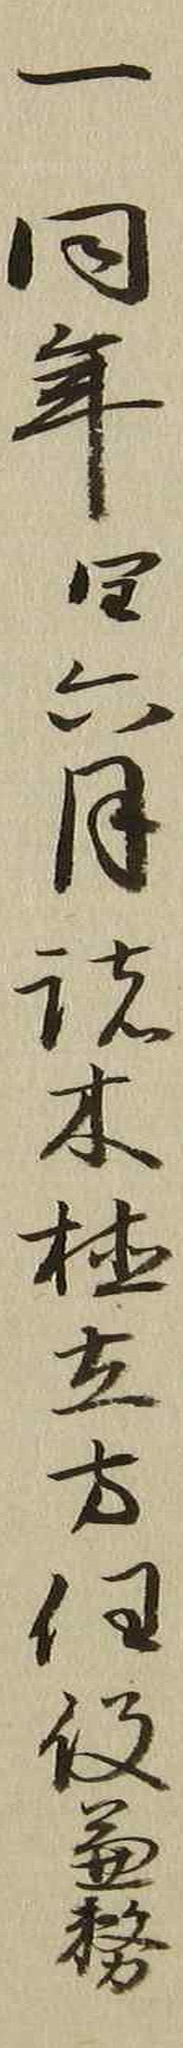一同年閏六月諸木植立方任役兼務
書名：諸士系譜　巻之61　と之部4
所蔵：会津若松市立会津図書館
